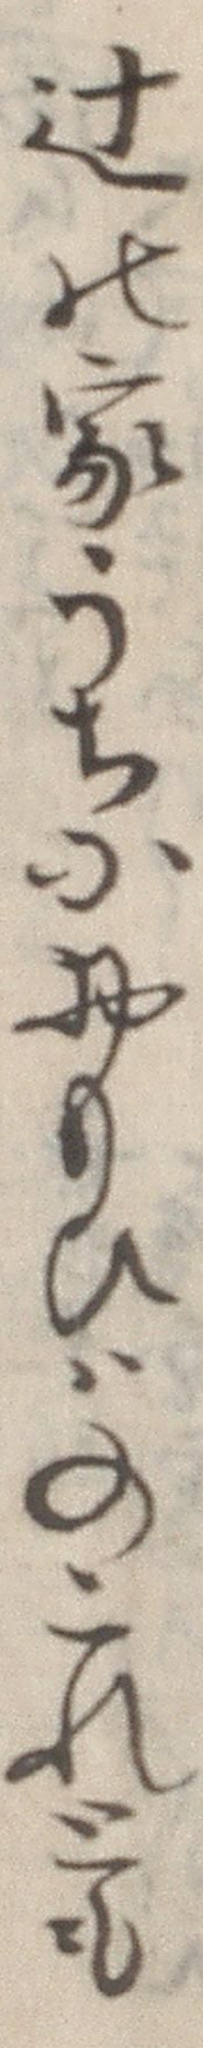辻の家うちにおもひはのこれとも
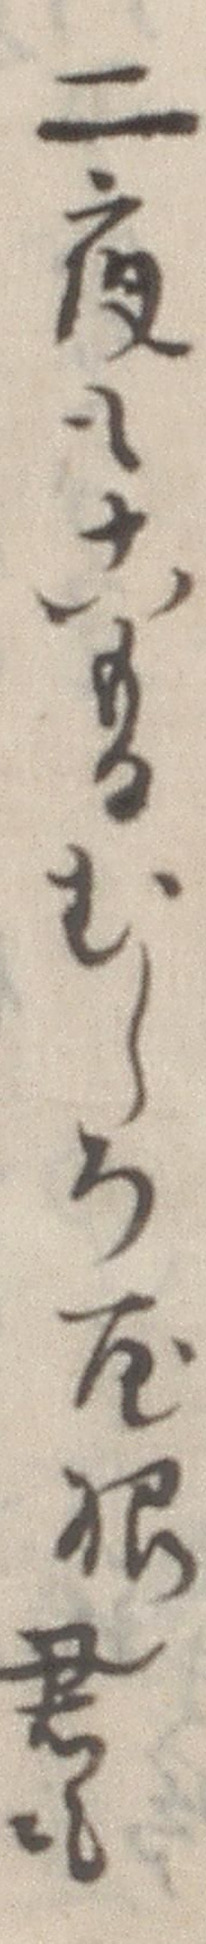二夜もこもるむしろ屋根君も
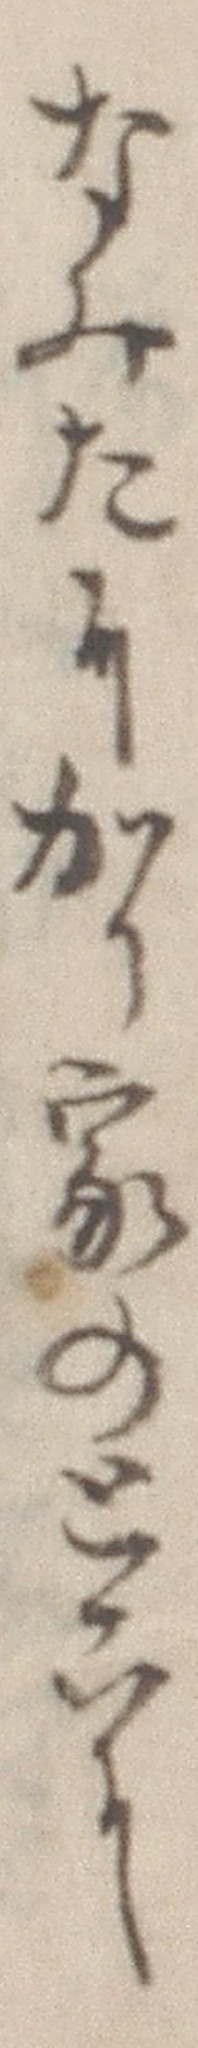なみたにかり家のとこに
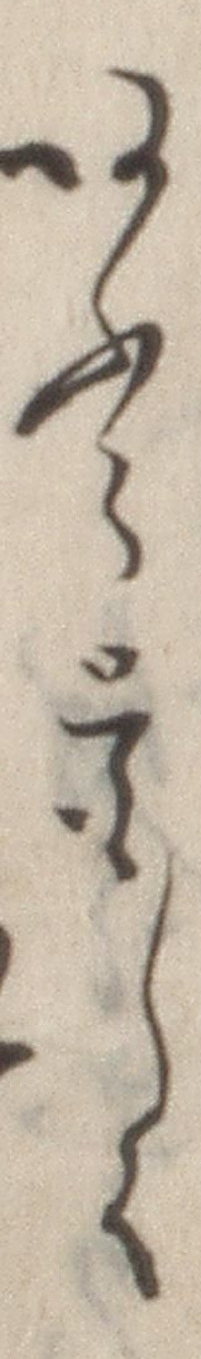あふらともしく
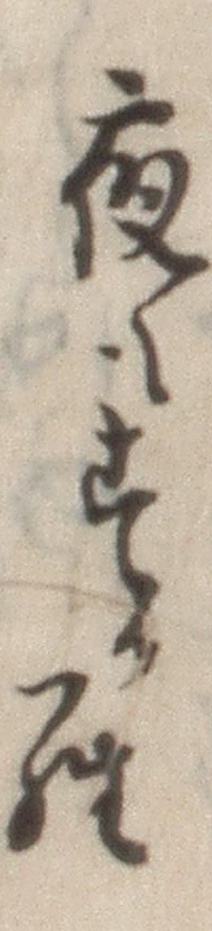夜もすから
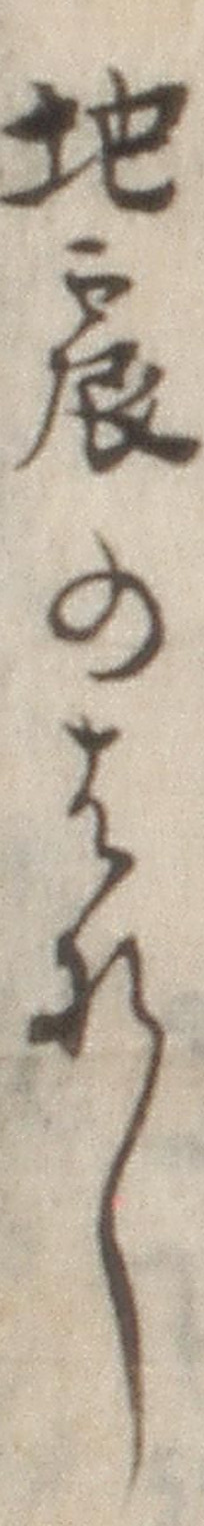地震のはなし
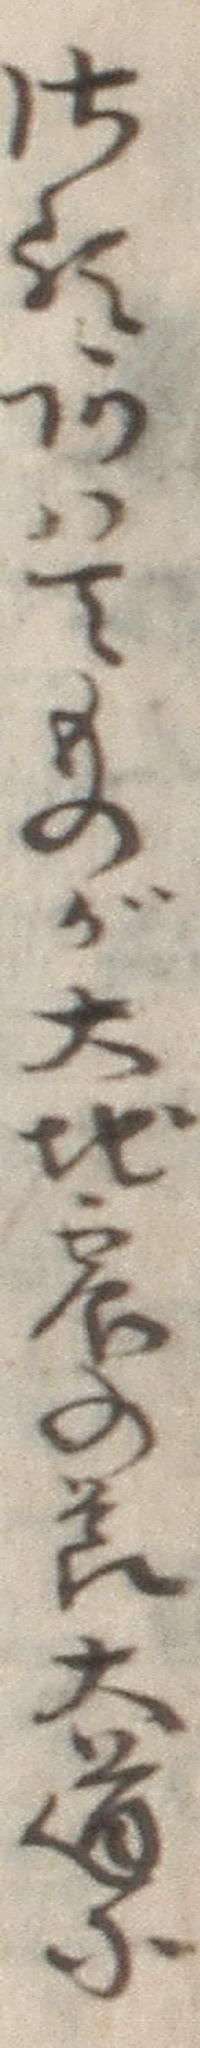さるあはてものが大地震の節大道に
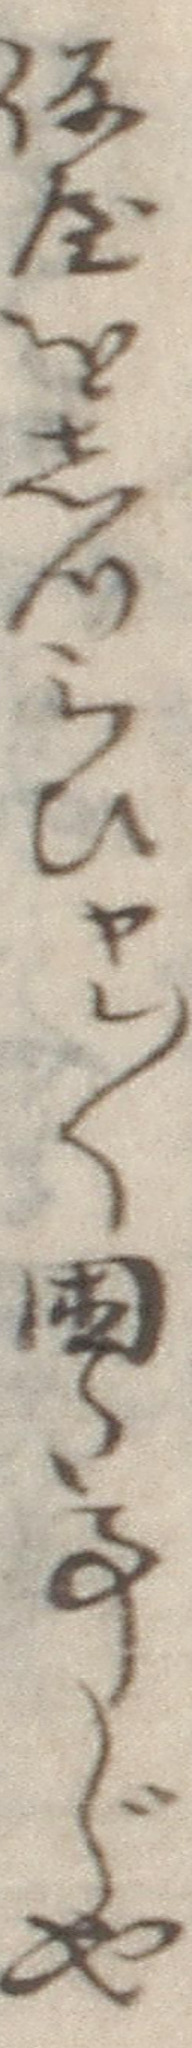仮屋をしつらひヤレ〳〵困た事じや
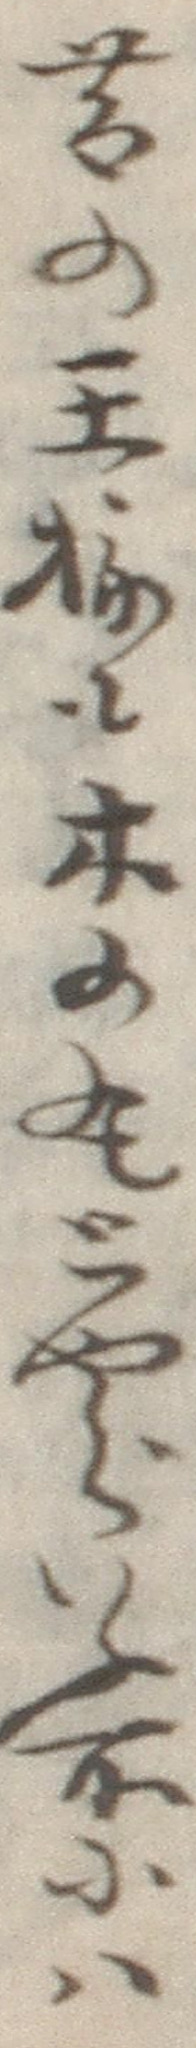昔の王様も木の丸とやらいふ所には
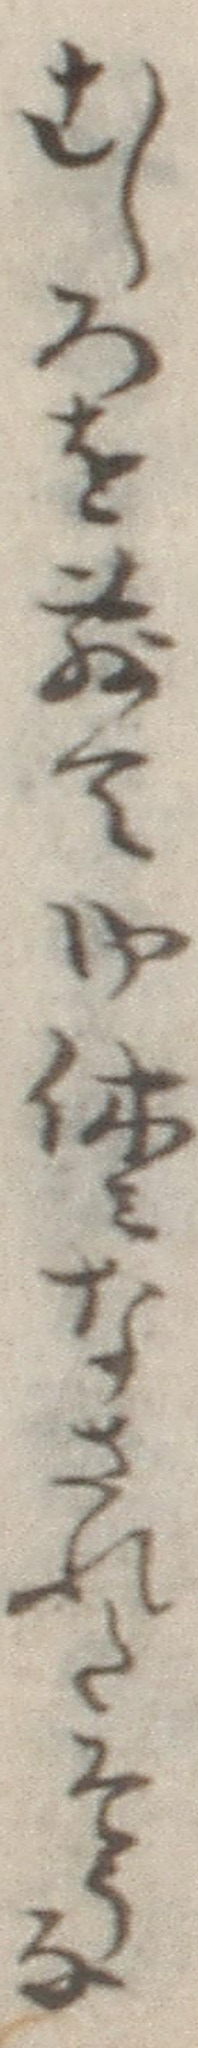むしろを敷て御休みなされたそうな
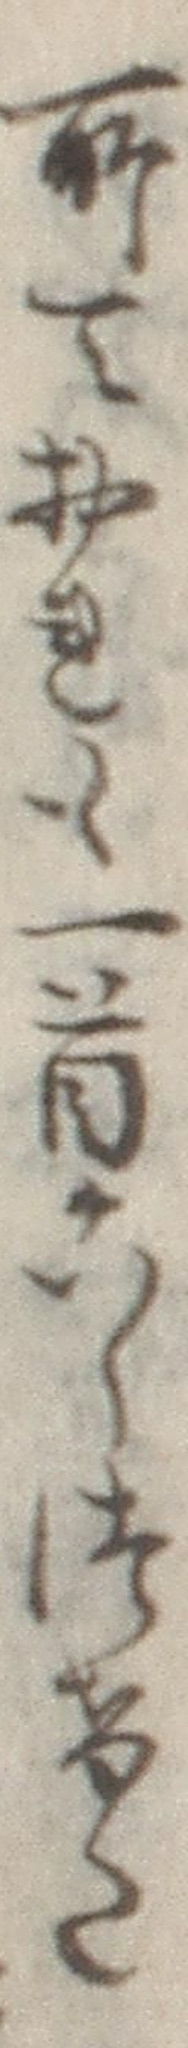所ておれも一首こしつけた
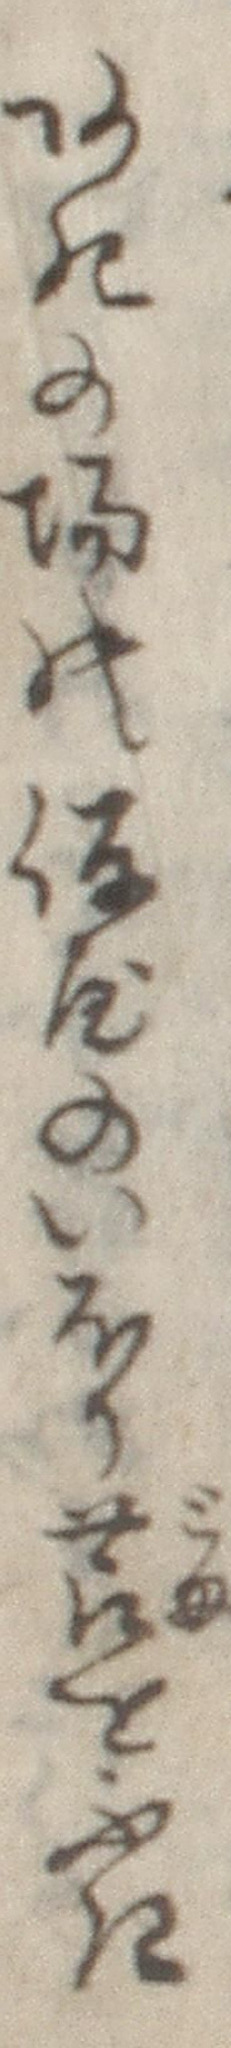あきの場の仮屋のいほり苫をふき

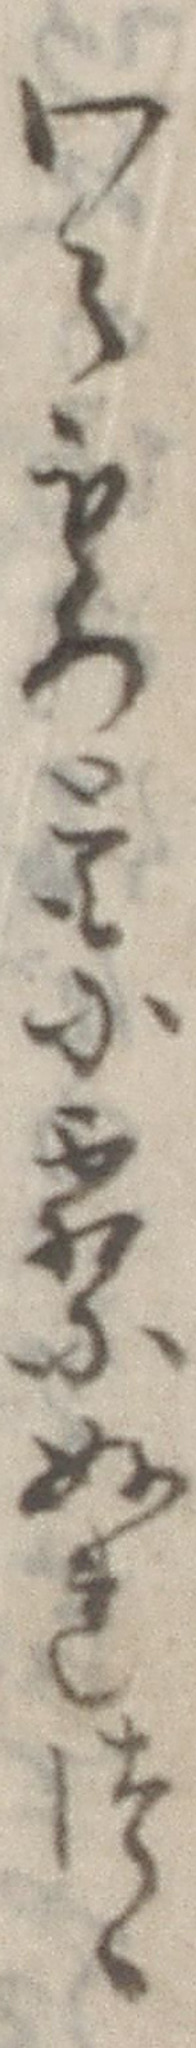わらもろともに霜にぬれつゝ
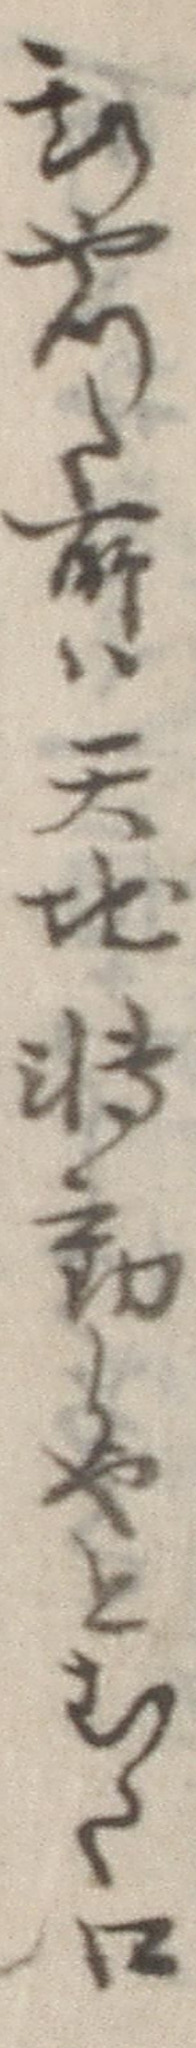斯やつた所は天地鳴動しやとむた口
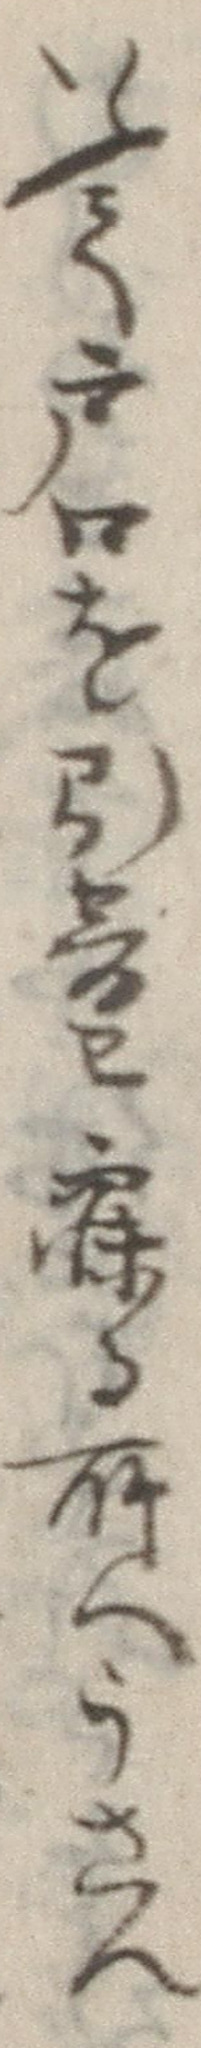いふて戸口を引寄せ寝る所へうさん
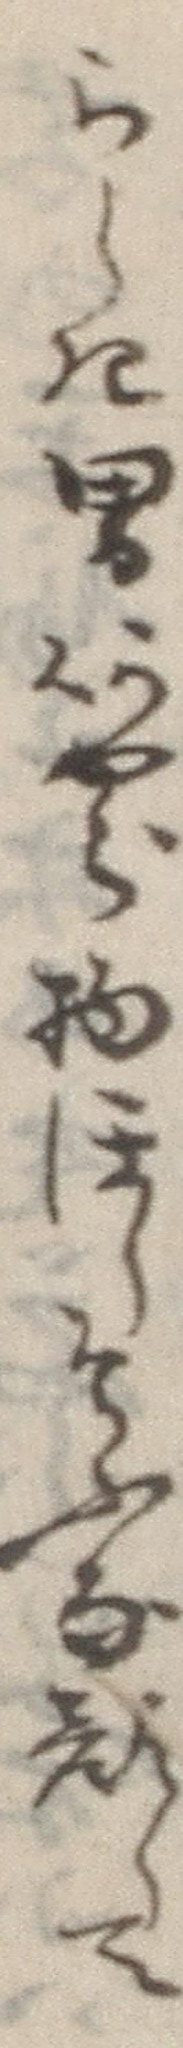らしき男何やら物ほしそふな顔して
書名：諸國大地震年代記末代噺種
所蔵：東京大学地震研究所図書室 Earthquake Research Institute Library, The University of Tokyo, JAPAN
